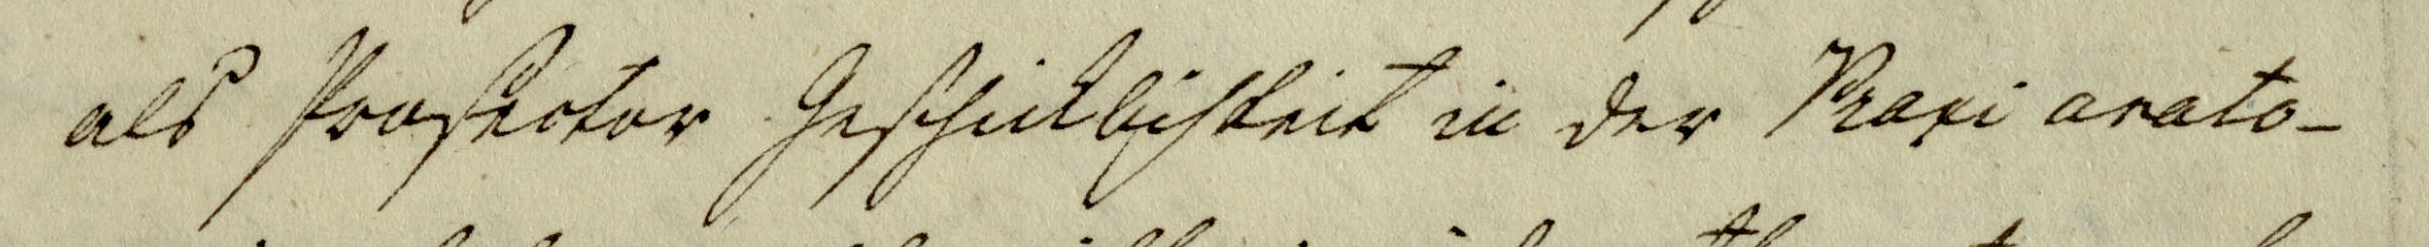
als Prosector Geschicklichkeit in der Praxi anato¬
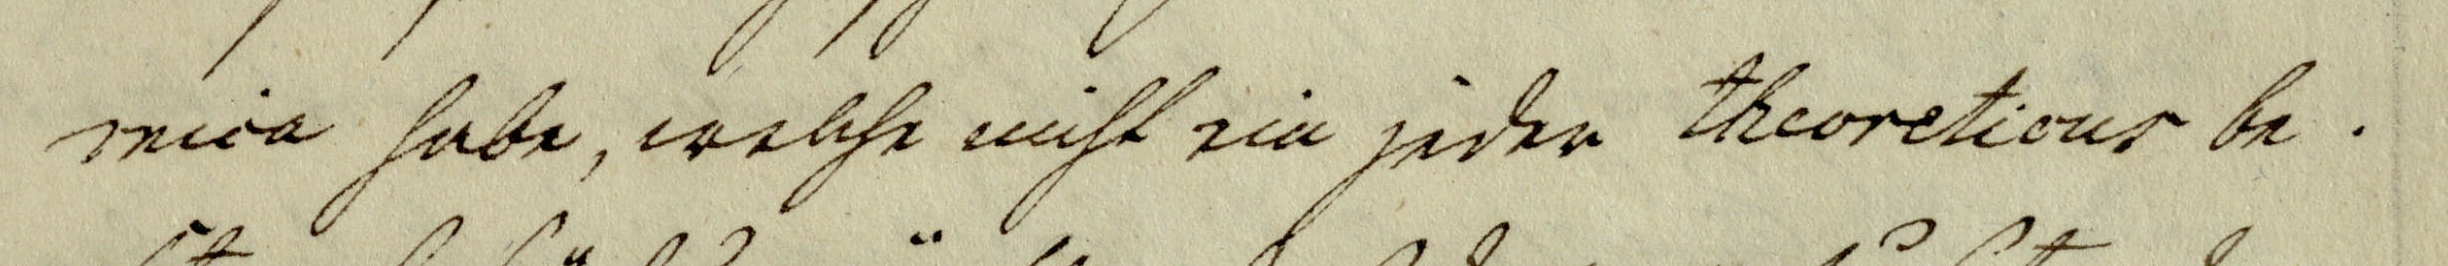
mica habe, welche nicht ein jeder theoreticus be¬
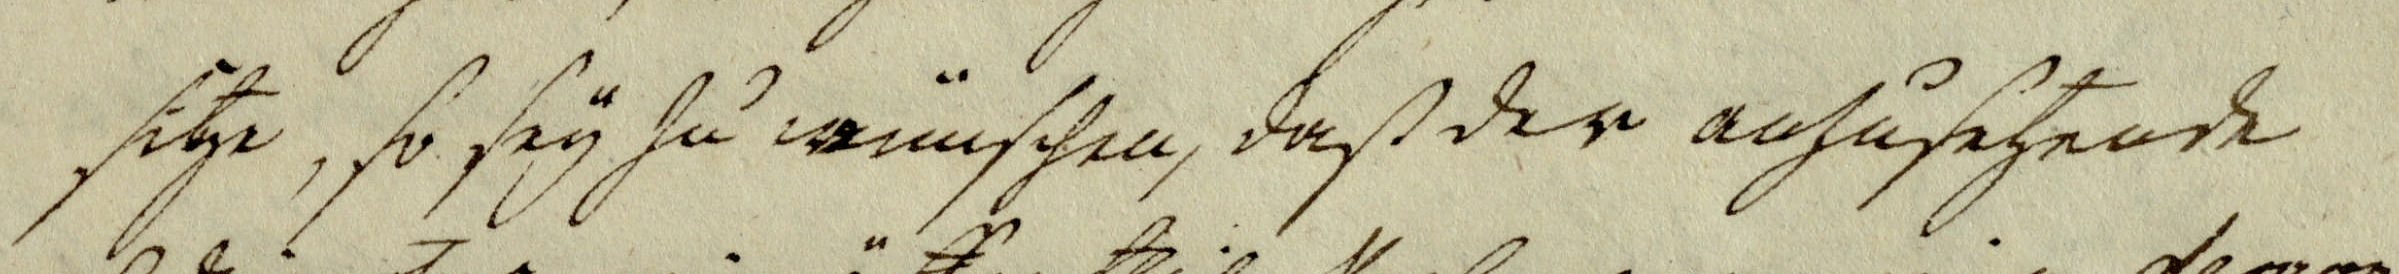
sitze, so seÿ zu wünschen, daß der anzusetzende
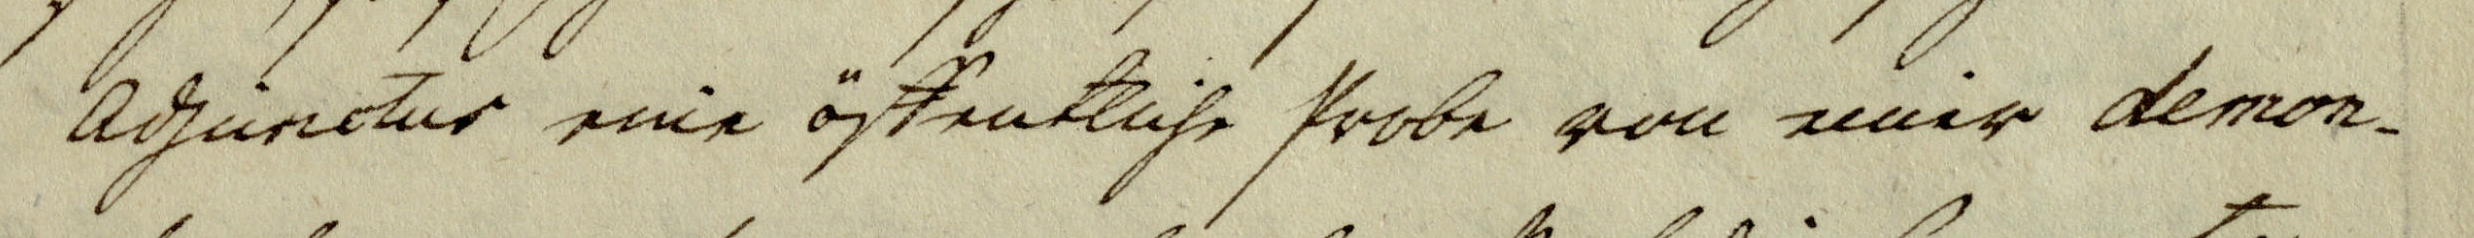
Adjunctus eine öffentliche Probe von einer demon-
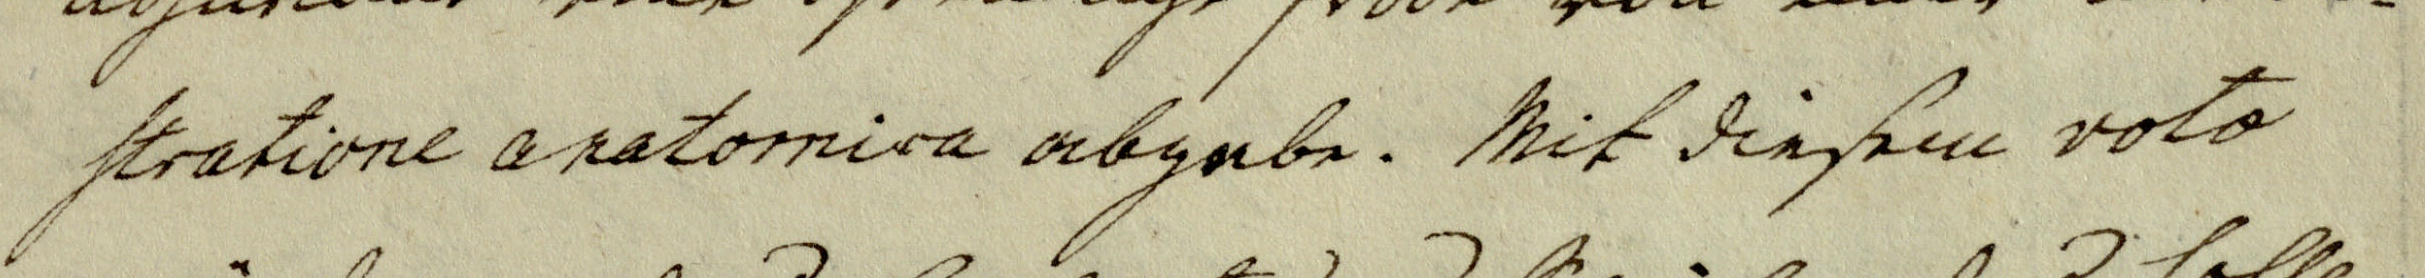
stratione anatomica abgebe. Mit diesem voto
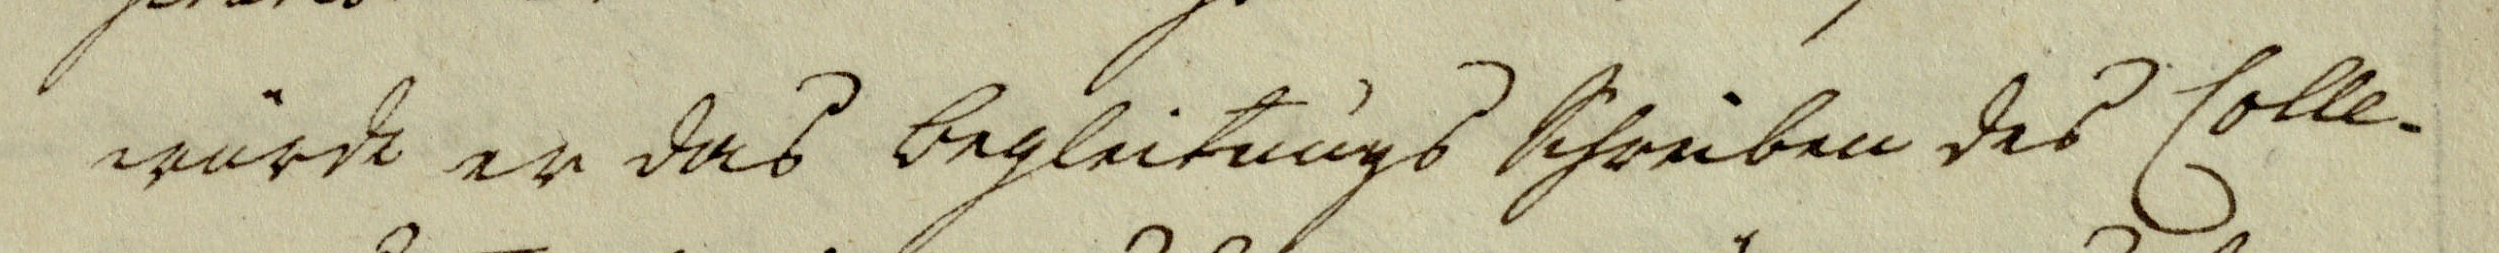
würde er das Begleitungs Schreiben des Colle¬
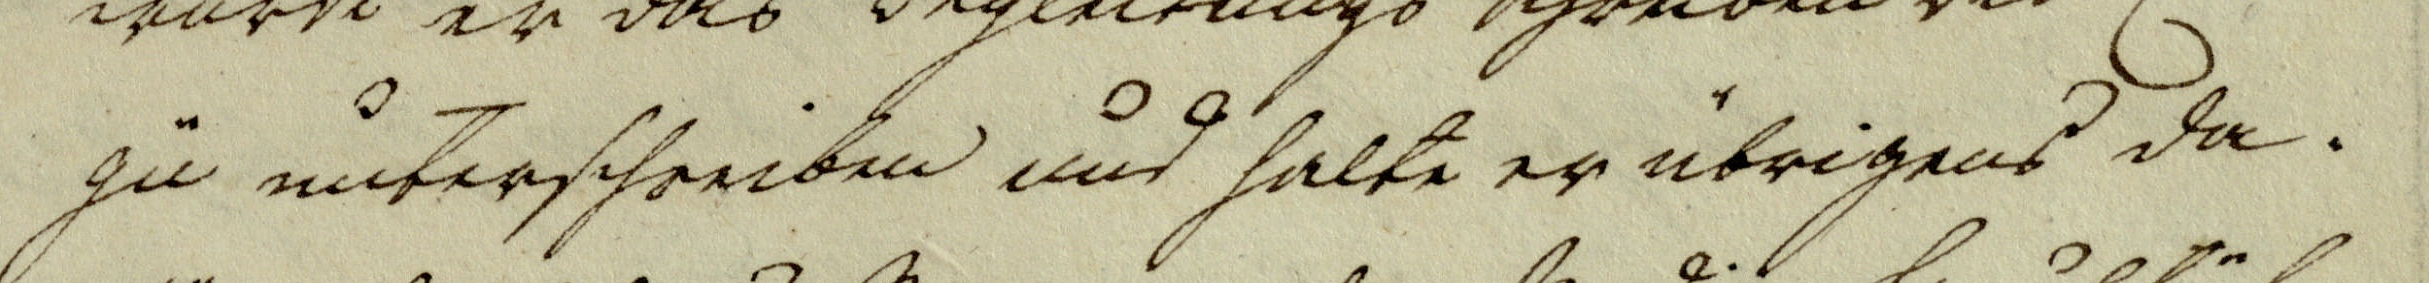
gii unterschreiben und halte er übrigens da¬
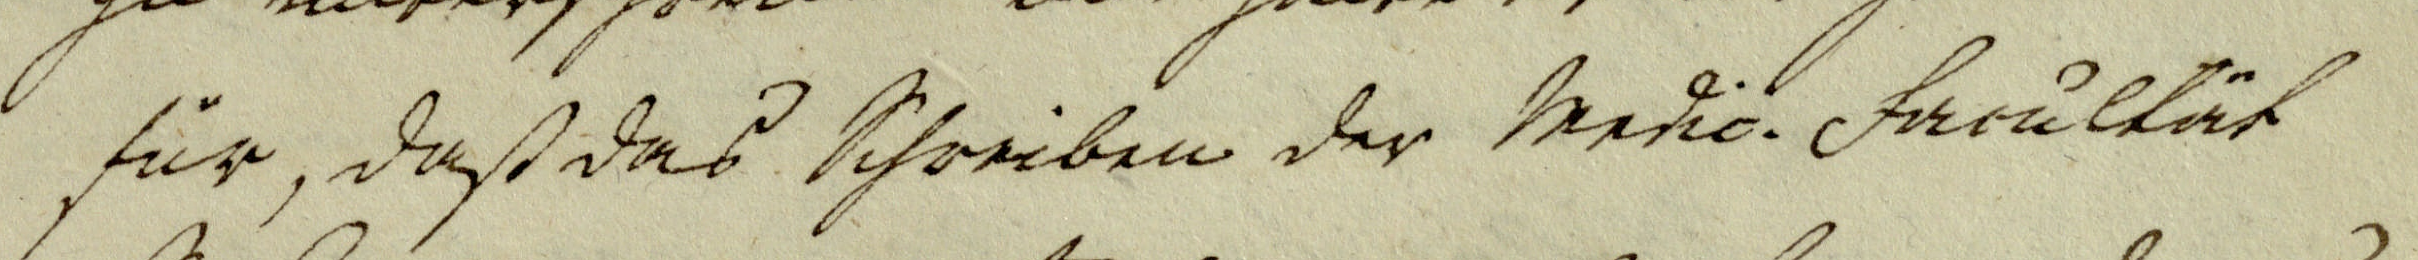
für, daß das Schreiben der Medic. Facultät
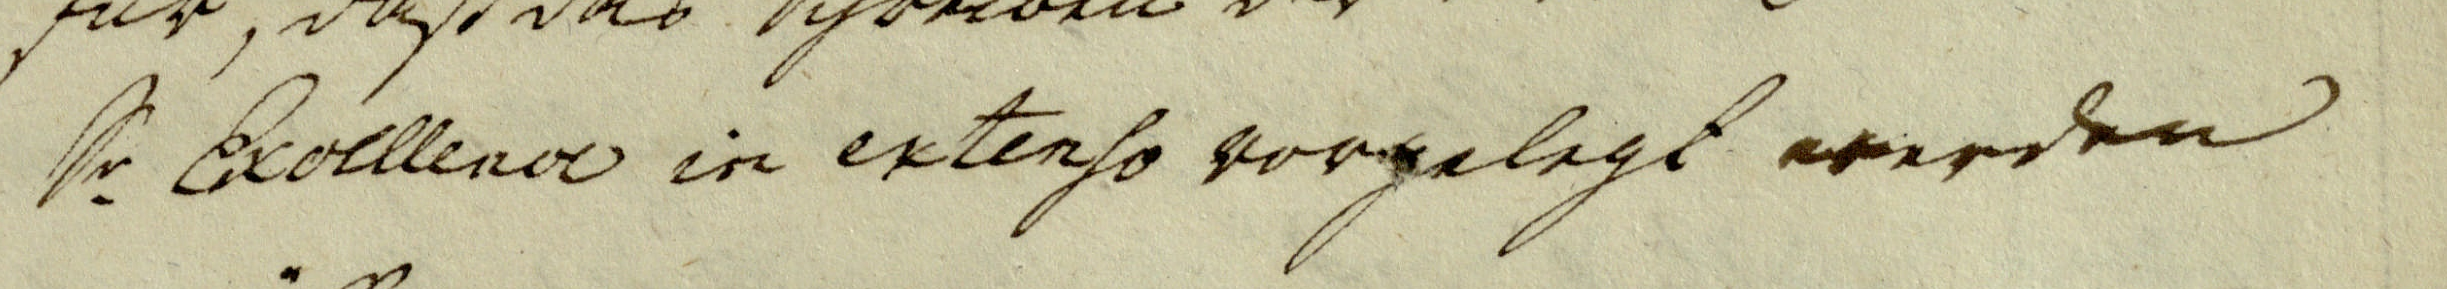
Sr Excellence in extenso vorgelegt werden
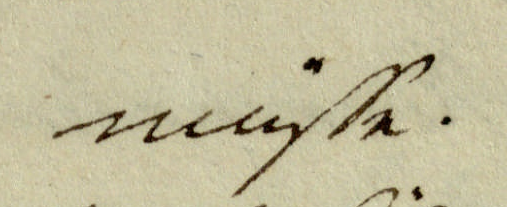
müsse.
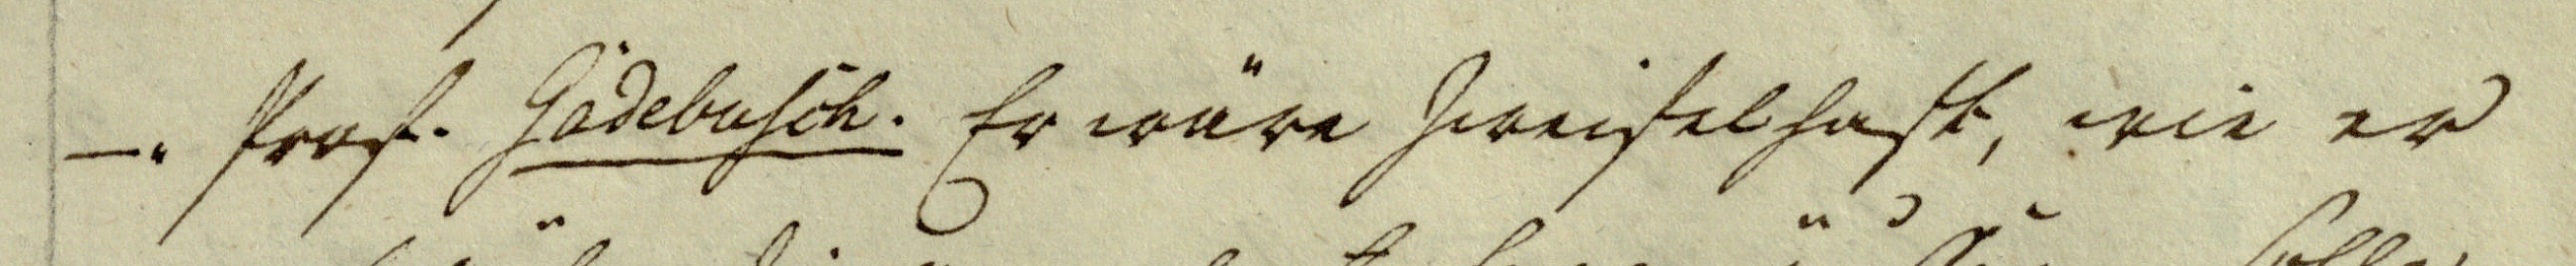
Prof. Gadebusch. Er wäre zweifelhaft, wie er
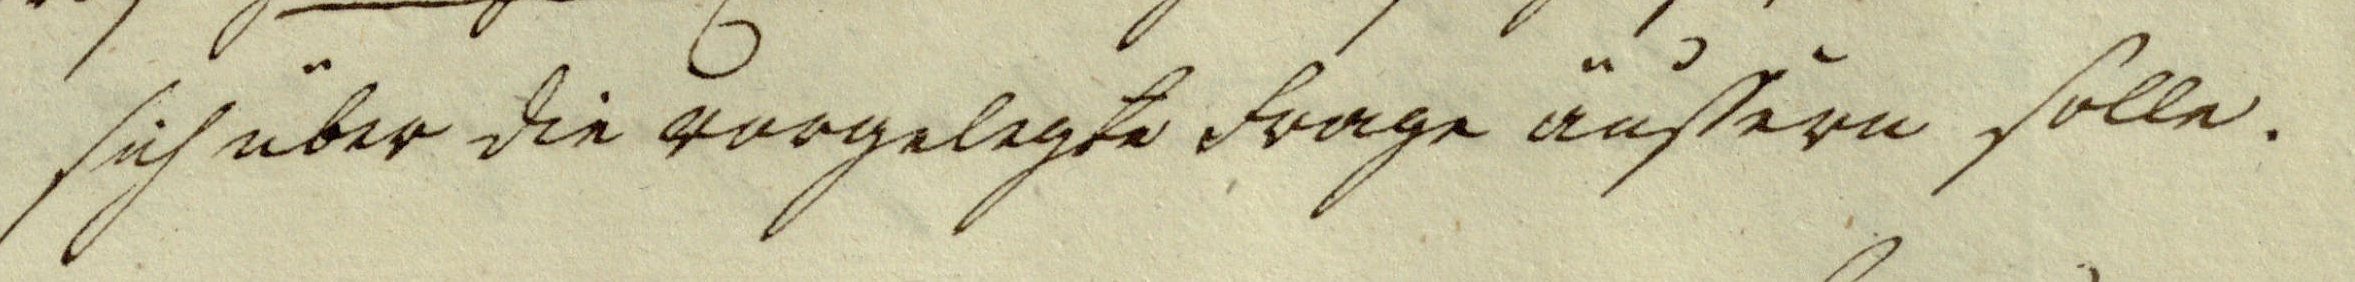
sich über die vorgelegte Frage äussern solle.
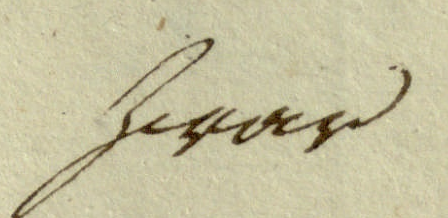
Zwar
